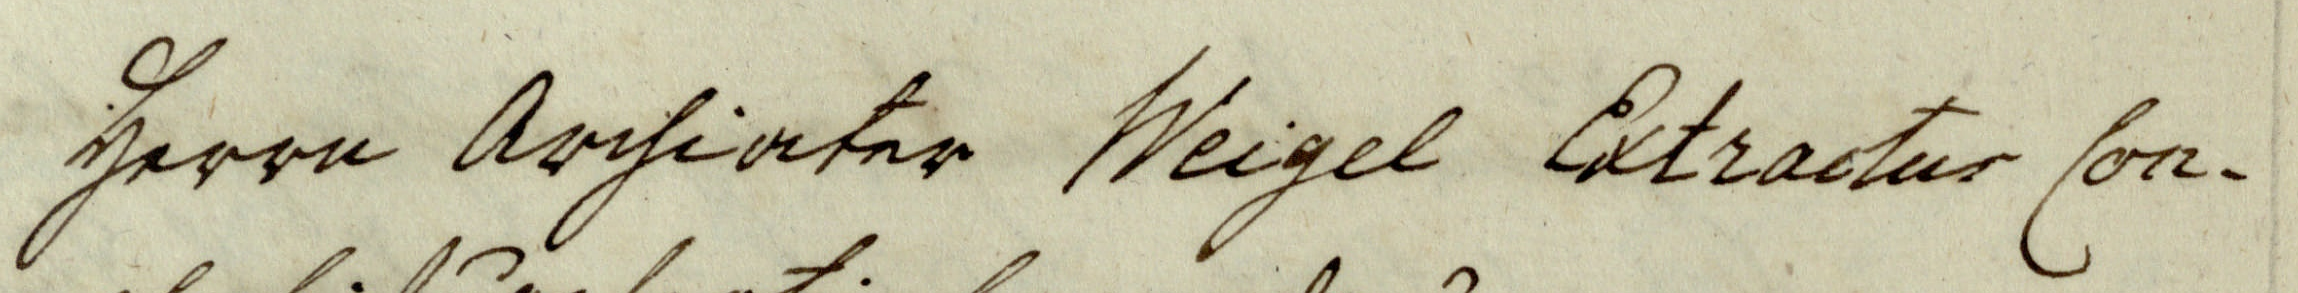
Herrn Archiater Weigel Extractus Con¬
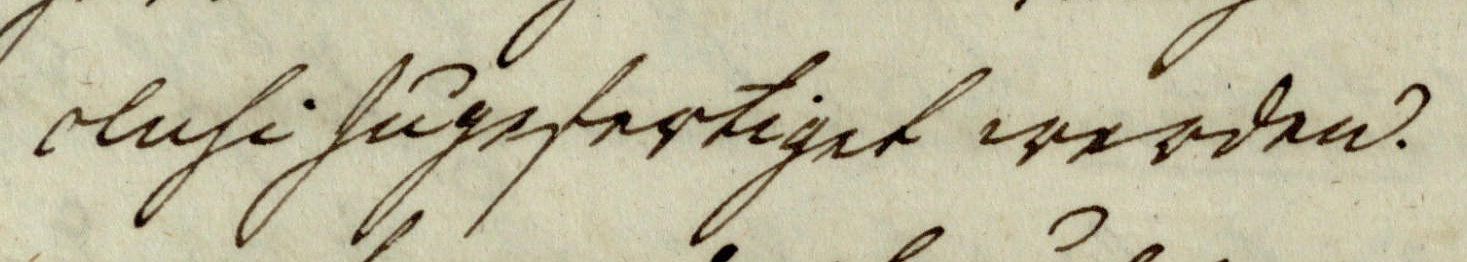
clusi zugefertiget werden.
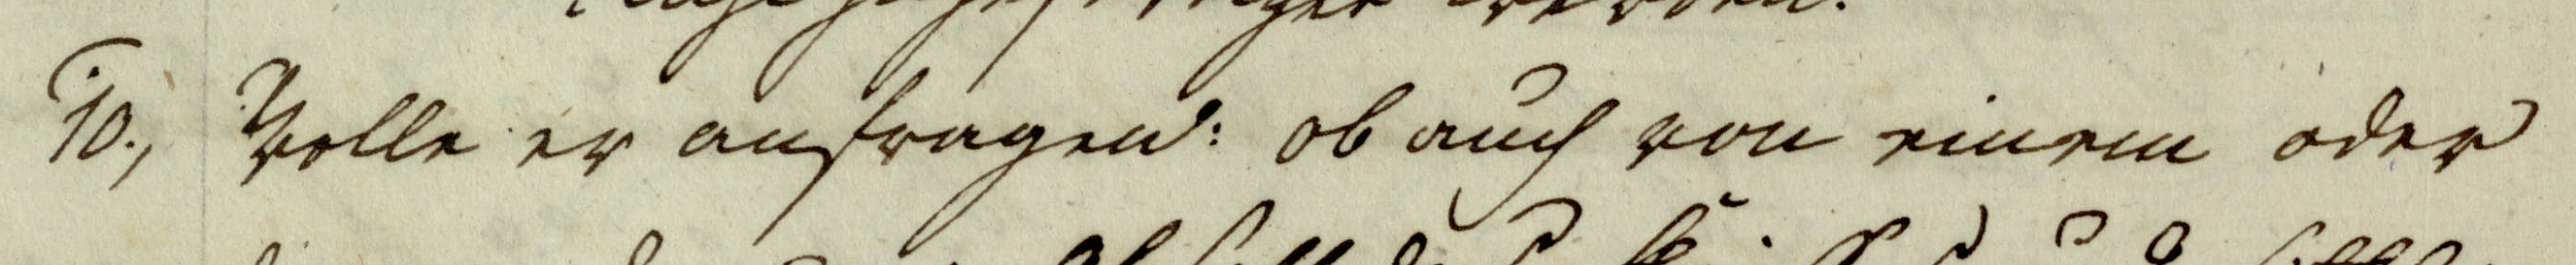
10., Wolle er anfragen: ob auch von einem oder
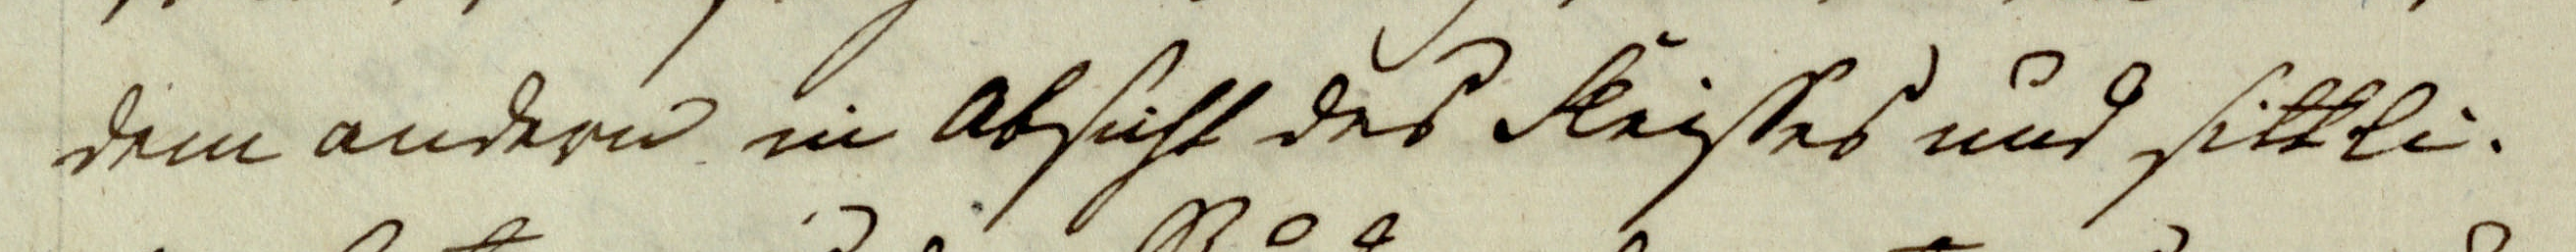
dem andern in Absicht des Fleisses und sittli¬
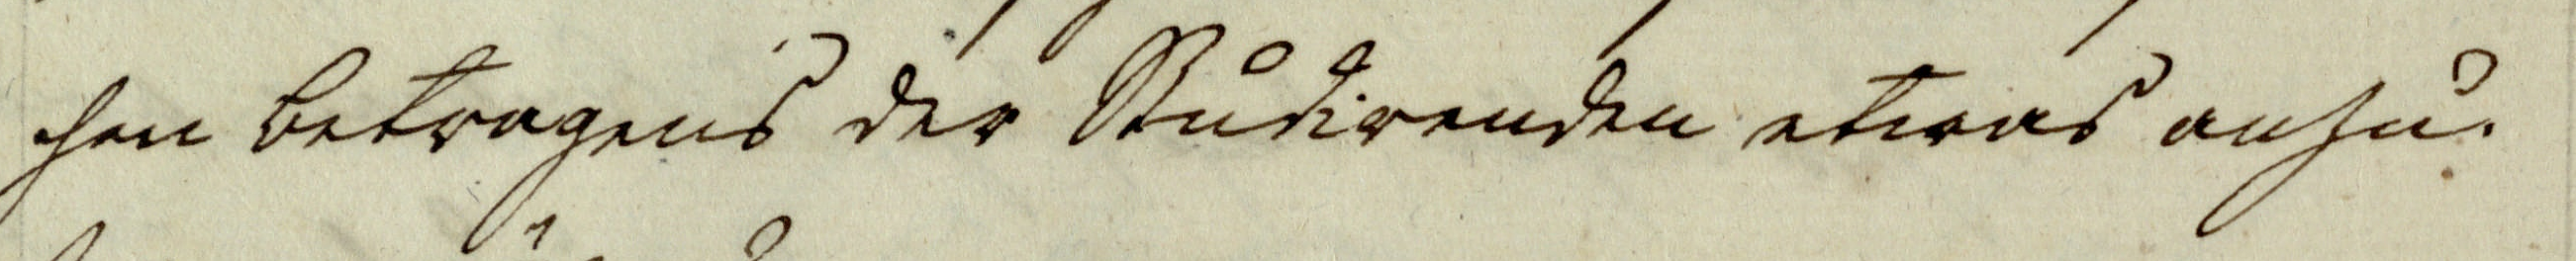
chen Betragens der Studirenden etwas anzu¬
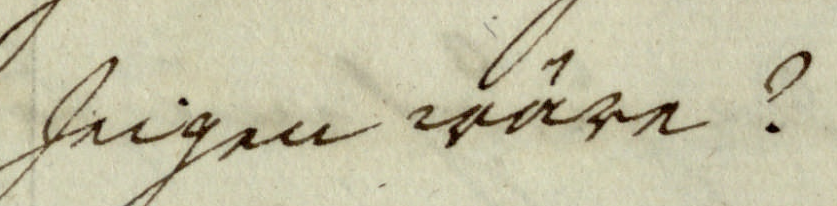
zeigen wäre?
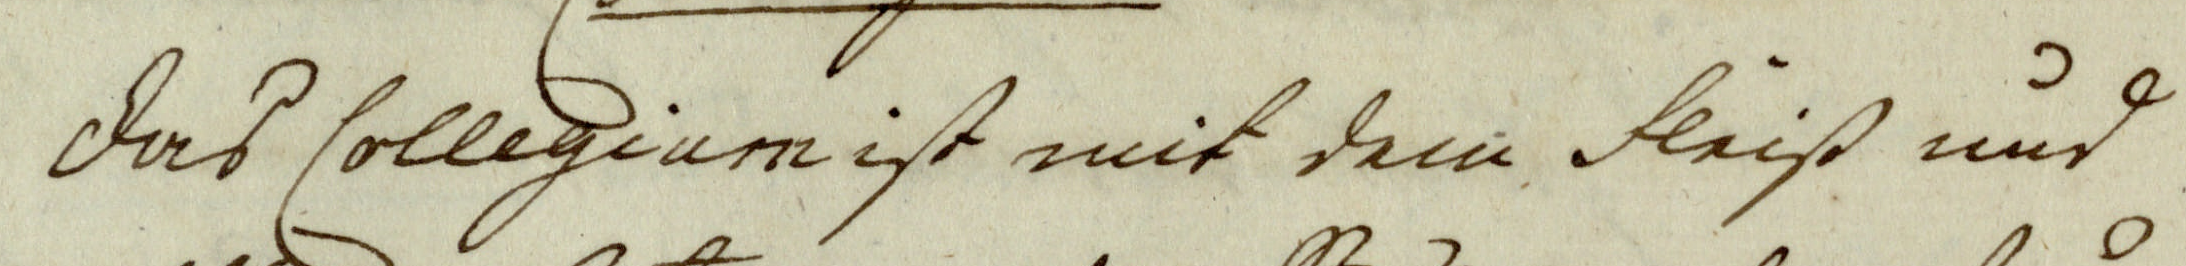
Das Collegium ist mit dem Fleiß und
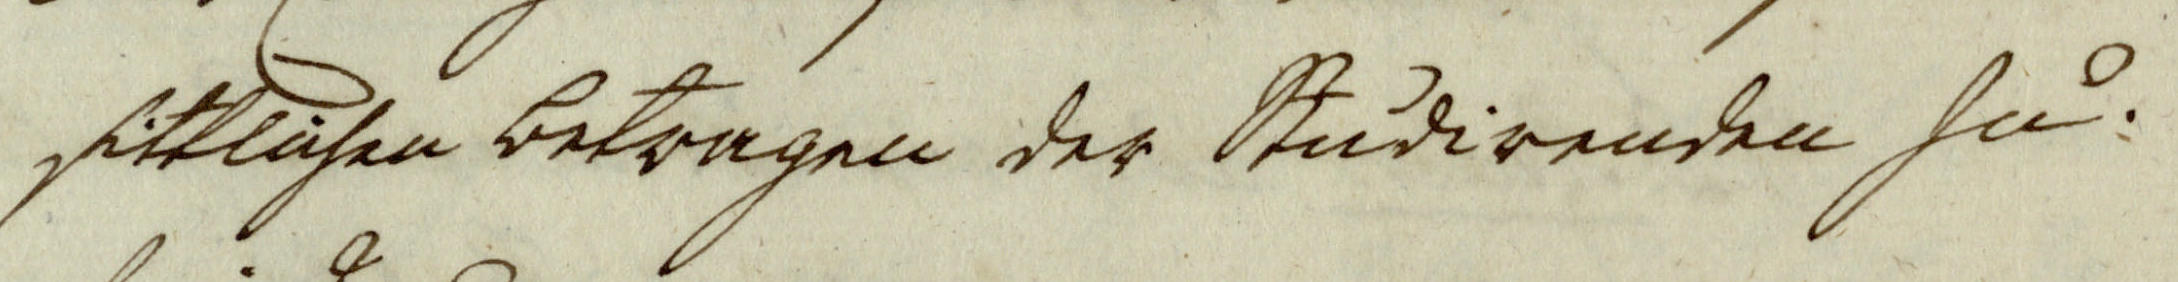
sittlichen Betragen der Studirenden zu¬
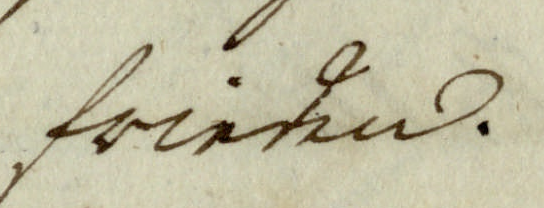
frieden.
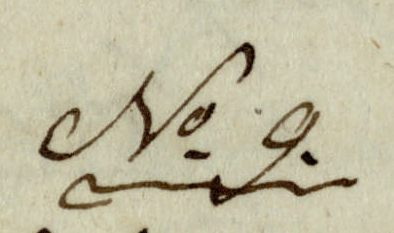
No 9.
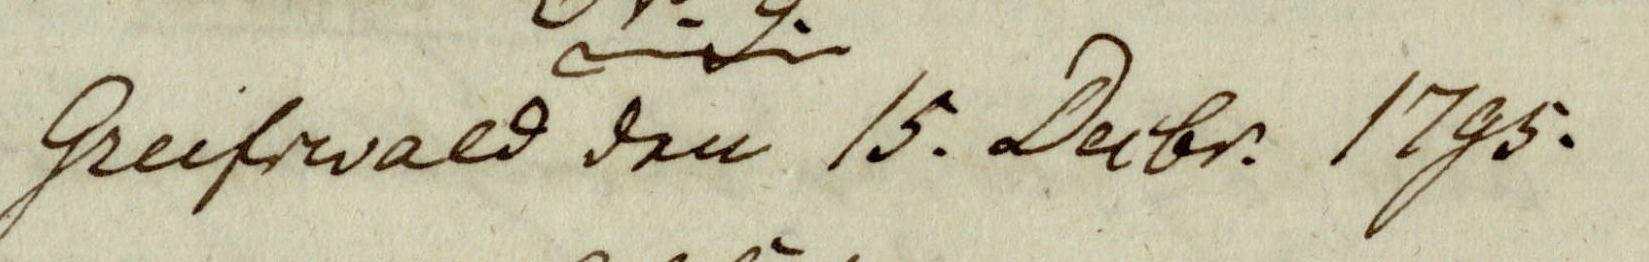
Greifswald dem 15. Decbr. 1795.
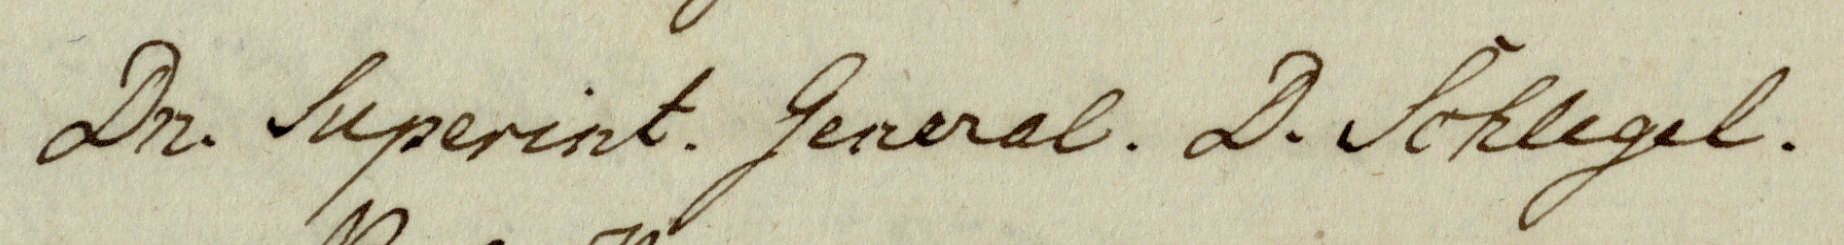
Dn. Superint. General. D. Schlegel.
